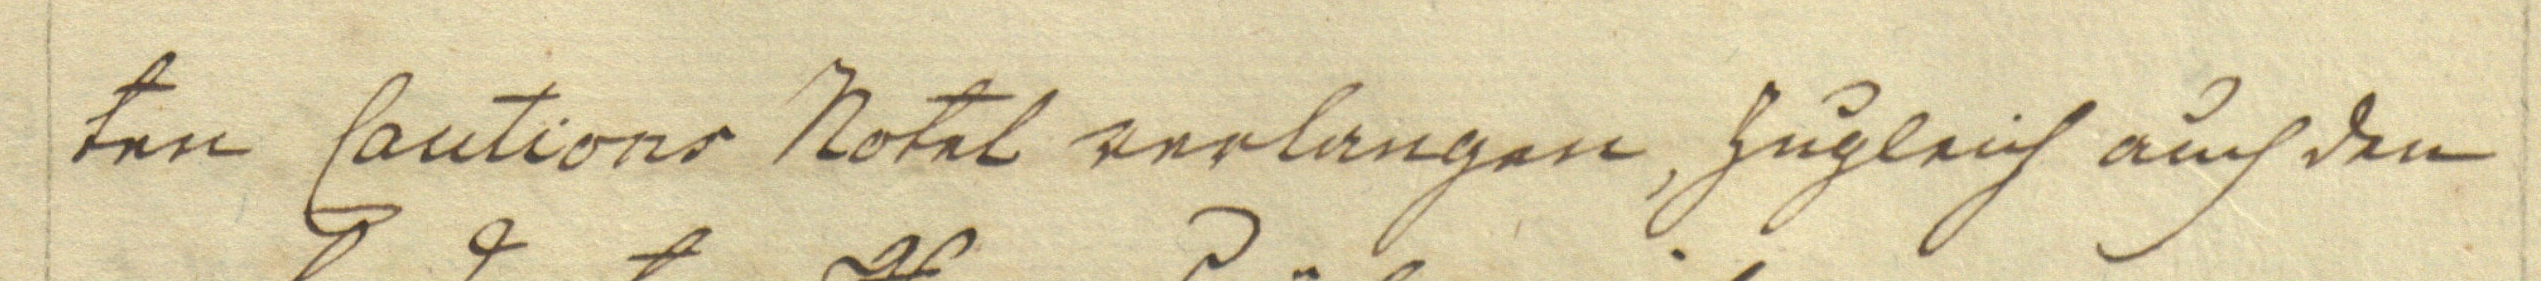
ten Cautions Notel verlangen, zugleich auch den
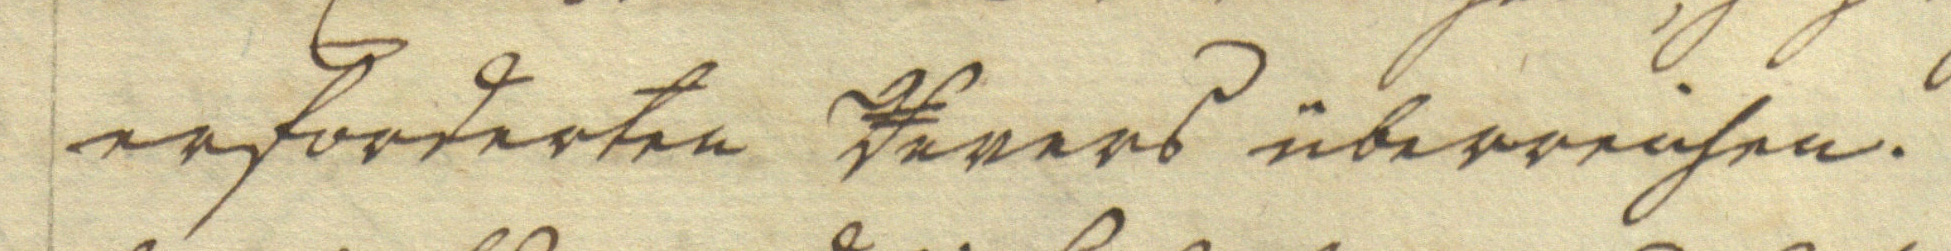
erforderten Revers überreichen.
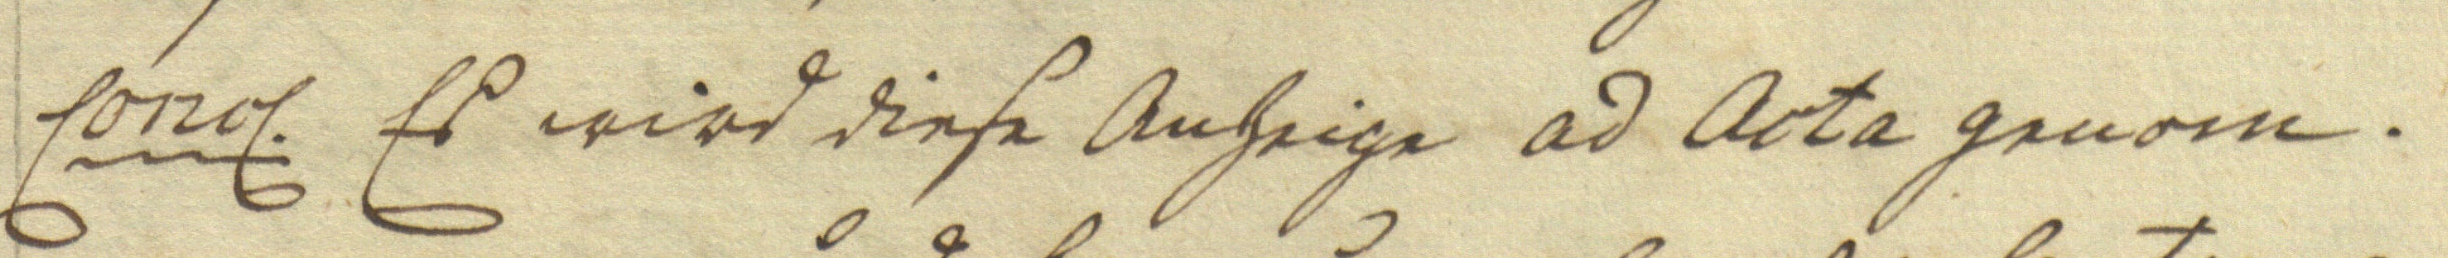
Concl. Es wird diese Anzeige ad Acta genom¬
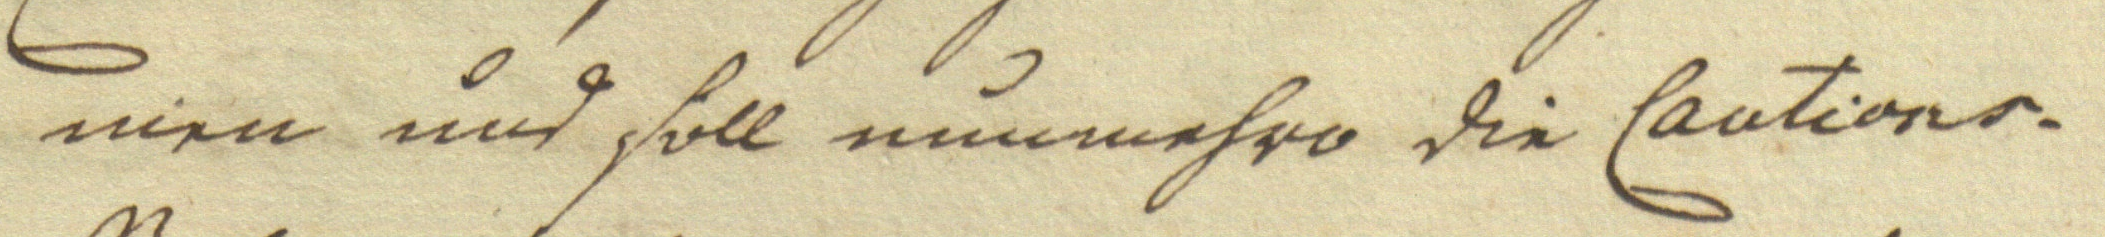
men und soll nunmehro die Cautions¬
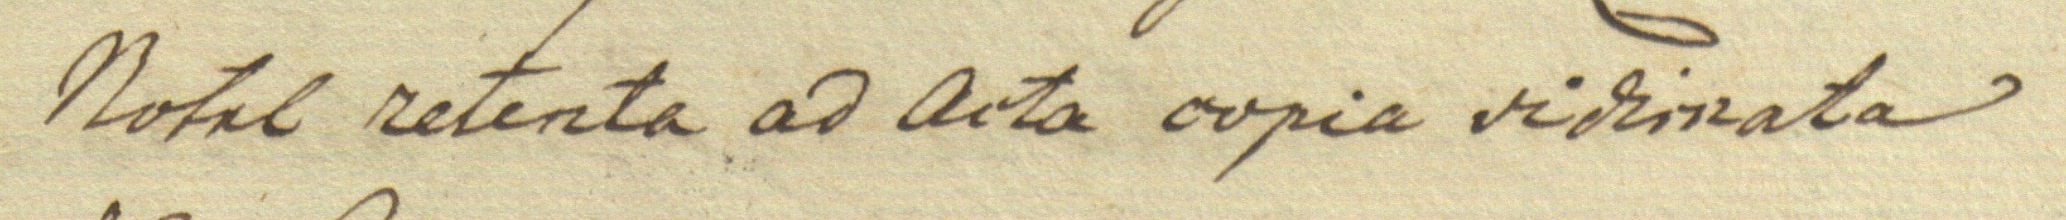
Notel retenta ad Acta copia vidimata
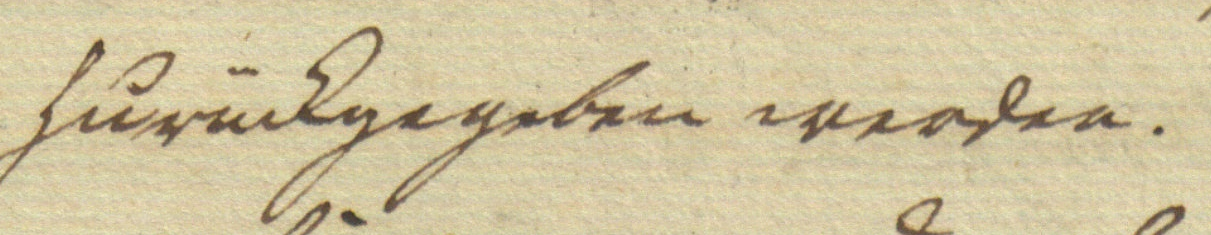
zurückgegeben werden.
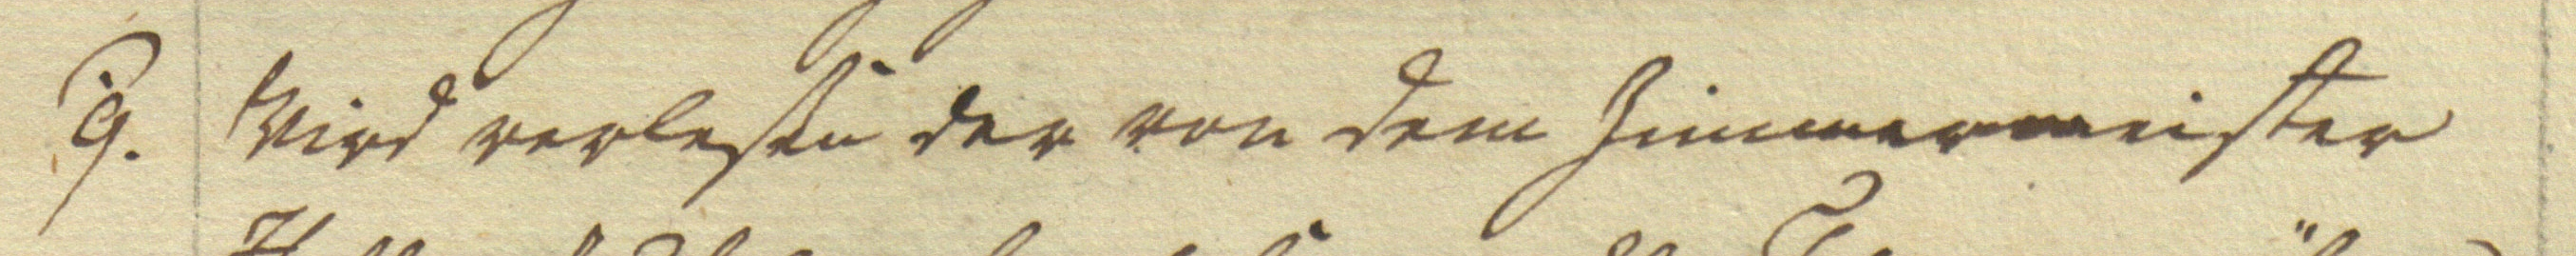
9. Wird verlesen der von dem Zimmermeister
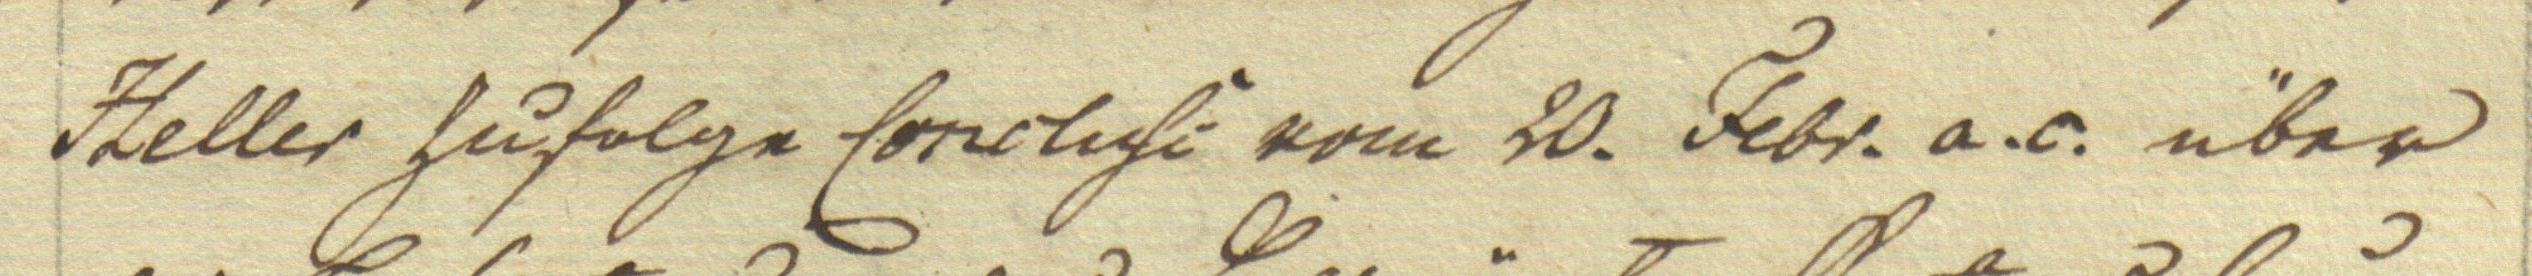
Heller zufolge Concluso vom 20. Febr. a. c. über
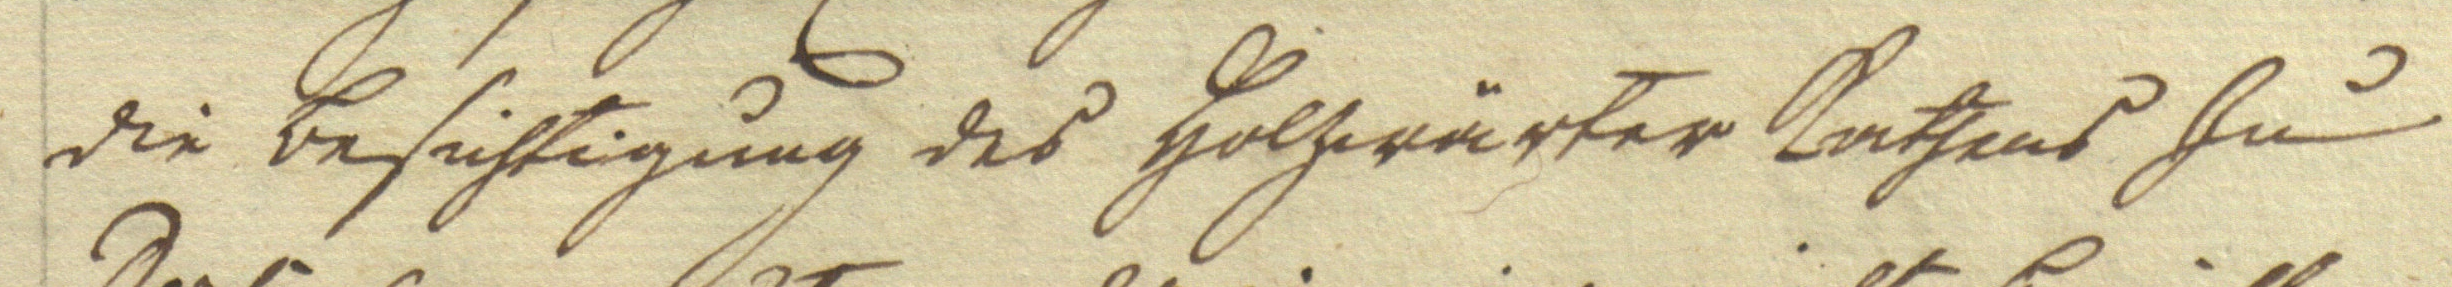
die Besichtigung des Holzwärter Kathens zu
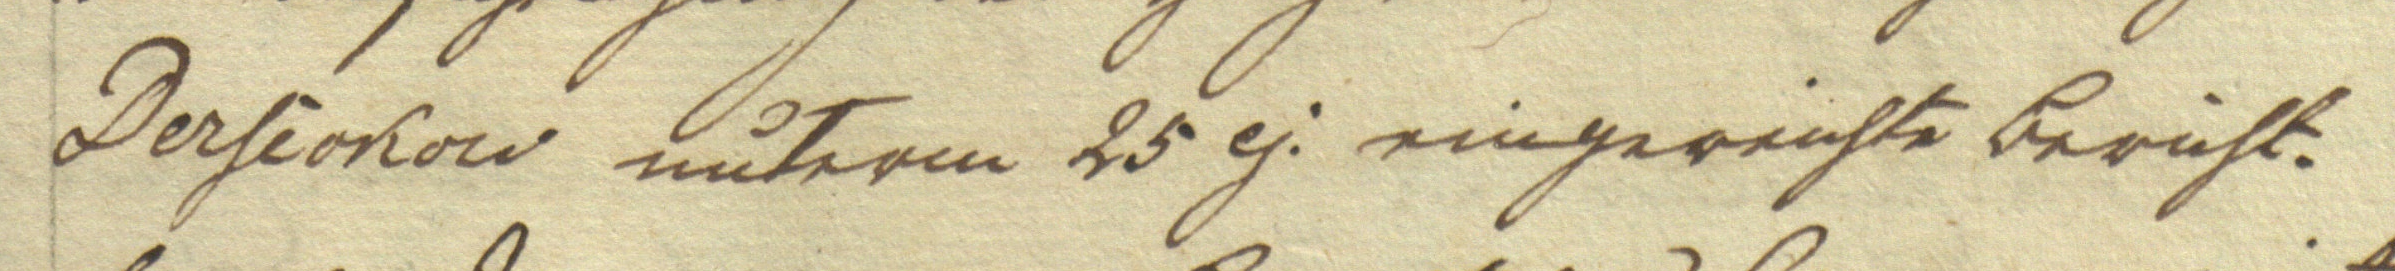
Derseckow unterm 25 ej. eingereichte Bericht.
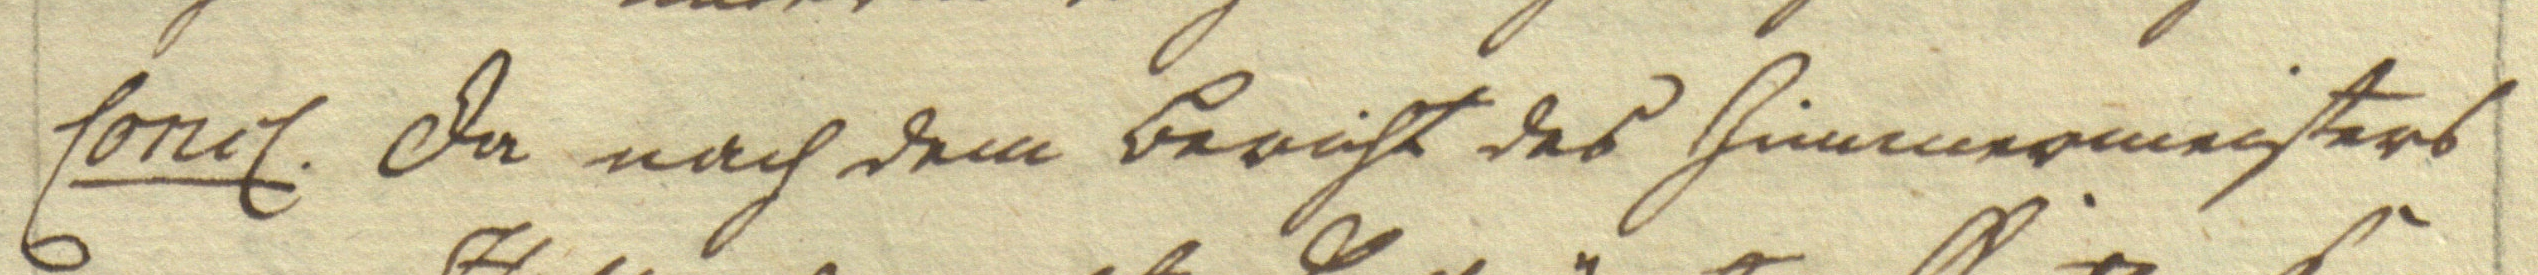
Concl. Da nach dem Bericht des Zimmermeisters
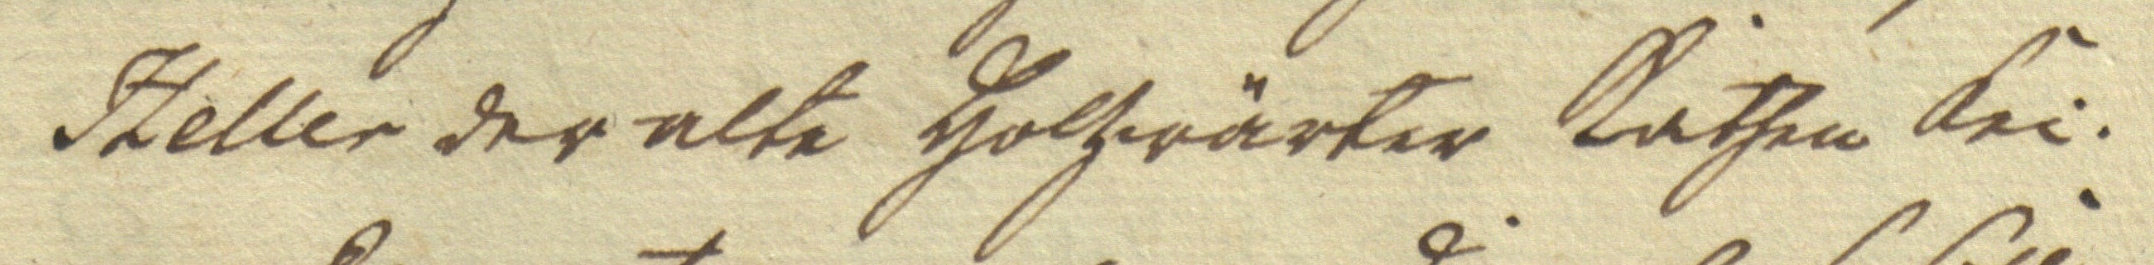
Heller der alte Holzwärter Kathen kei¬
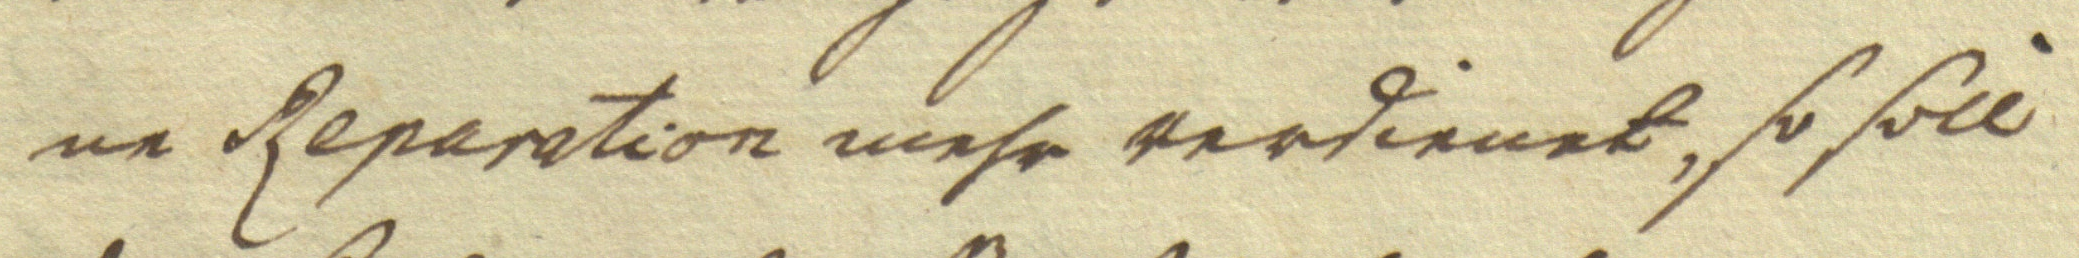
ne Reparation mehr verdienet, so soll
